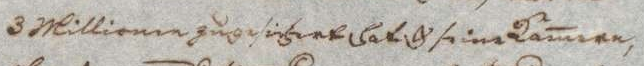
3 Millionen zugesichert hat & seine Kammern,
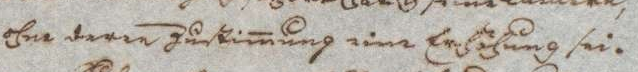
ohne deren Zustimmung eine Erhöhung sei-
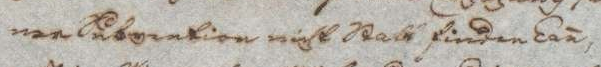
ner Subvention nicht Statt finden kann,
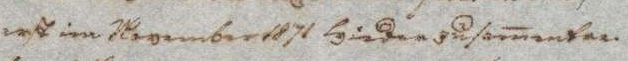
erst im November 1871 wieder zusammentre-
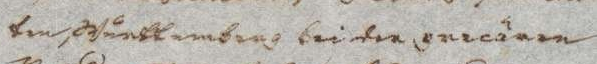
ten, Württemberg bei der precären
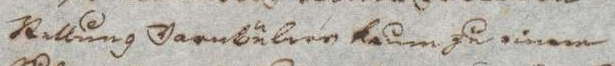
Stellung Varnbühler's kaum zu einem
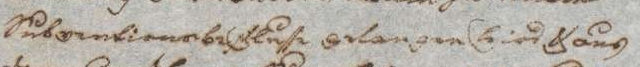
Subventionsbeschlusse gelangen wird & aus
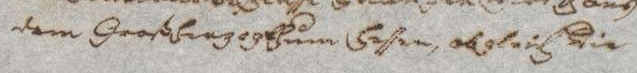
dem Großherzogthum Hessen, obgleich die
